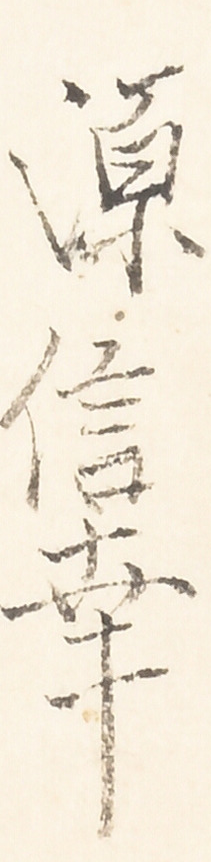源信幸
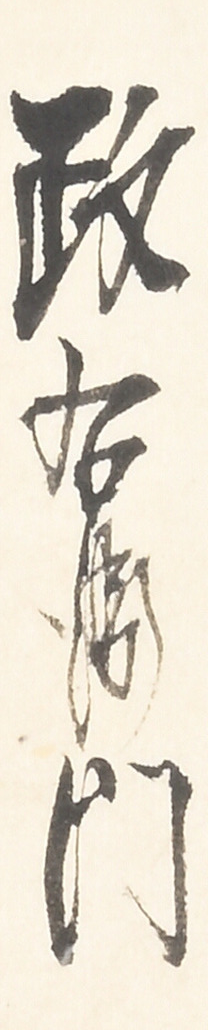政右衛門

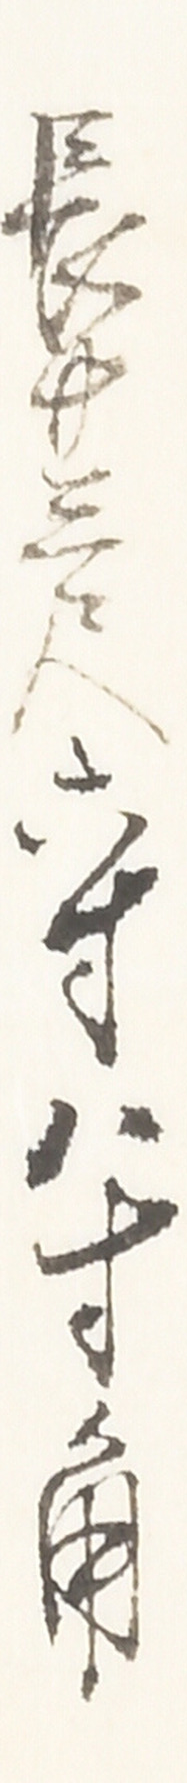長サ三尺六寸八寸角
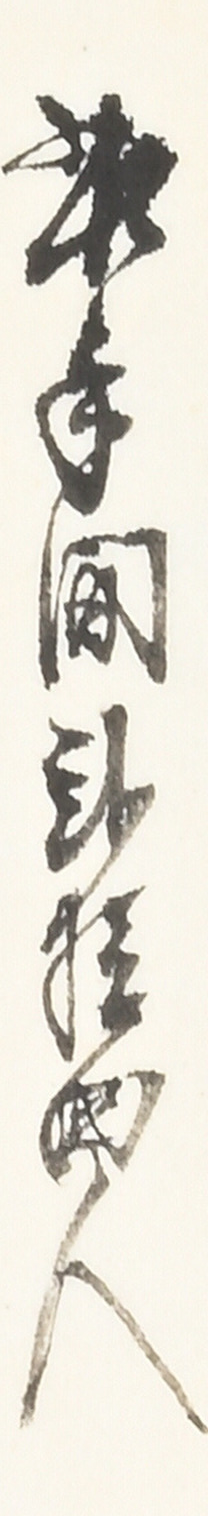此手間弐拾四人
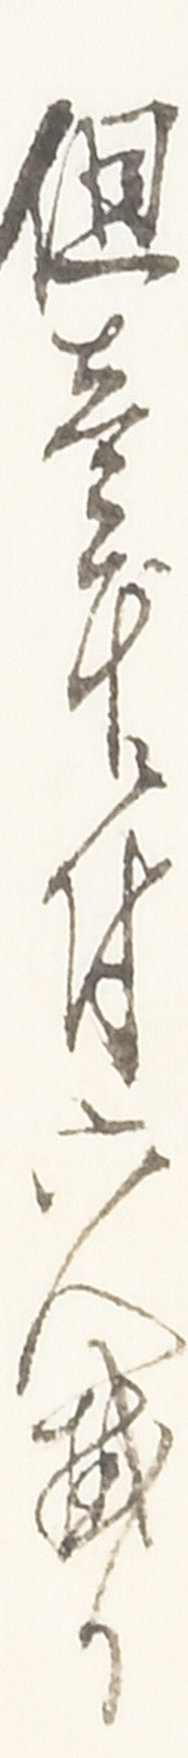但壱本ニ付六人掛り
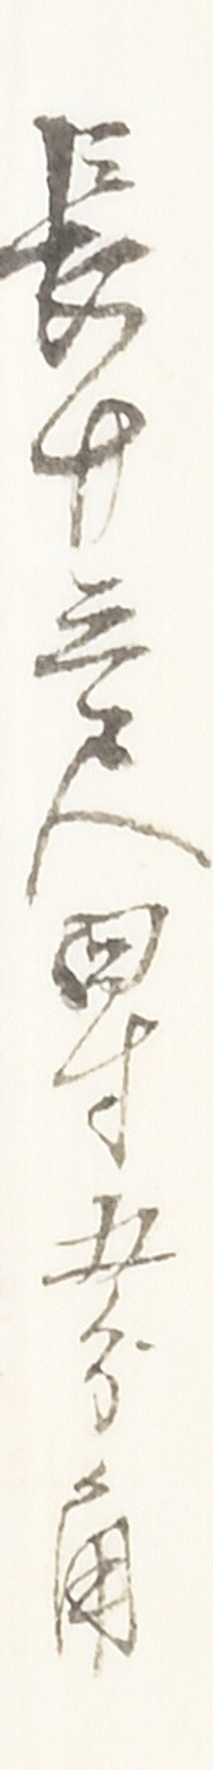長サ三尺四寸五分角
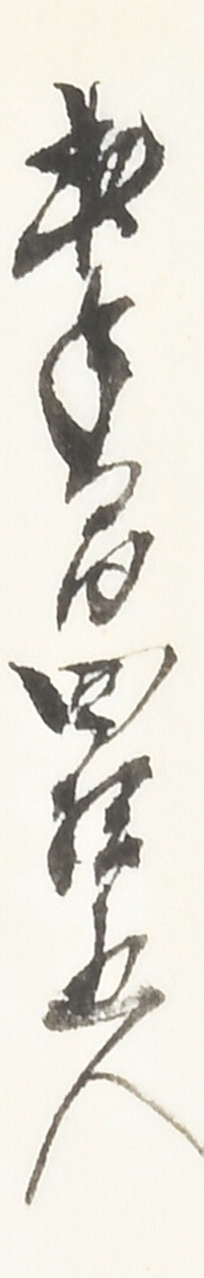此手間四拾五人
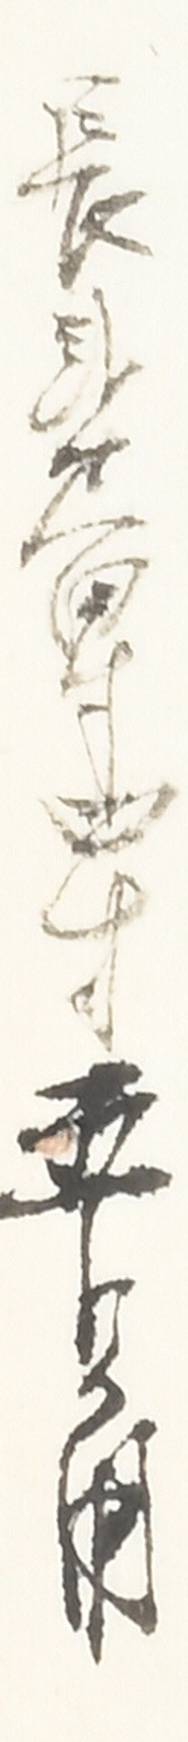長弐尺四寸四寸五分角
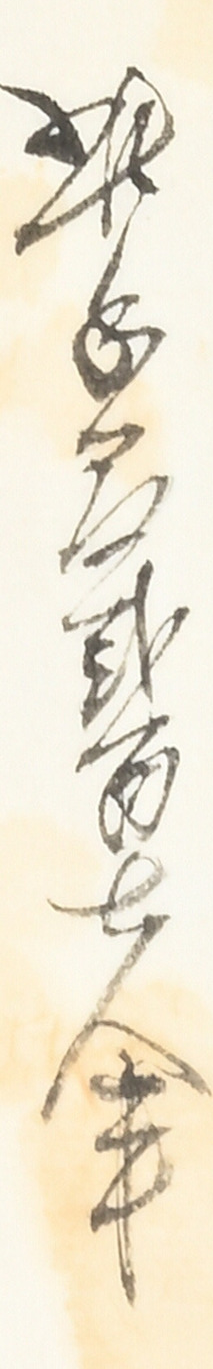此手間弐拾四人

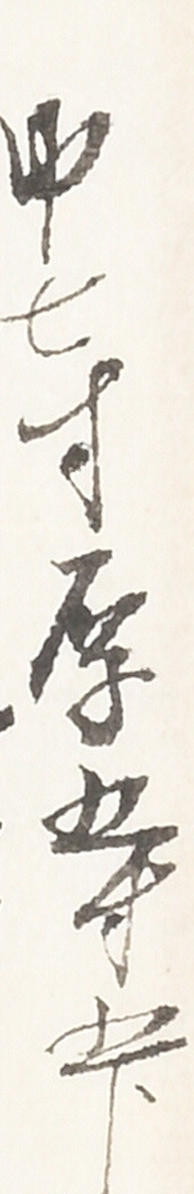巾七寸厚五寸五分
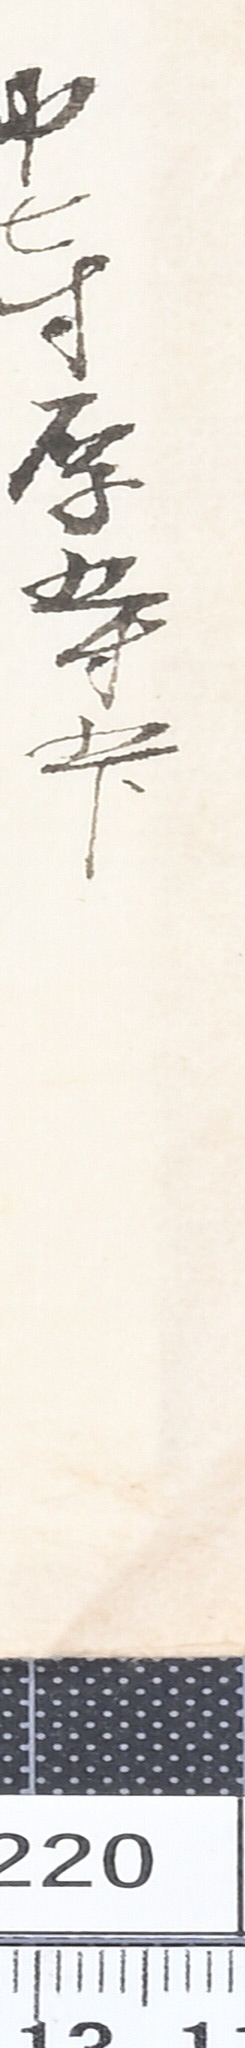巾七寸厚五寸五分
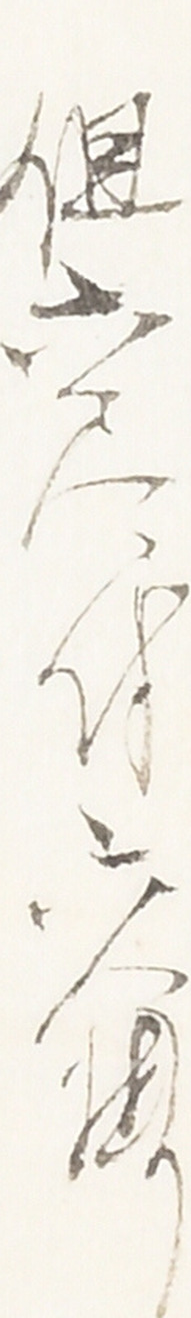但六尺ニ付六人掛り
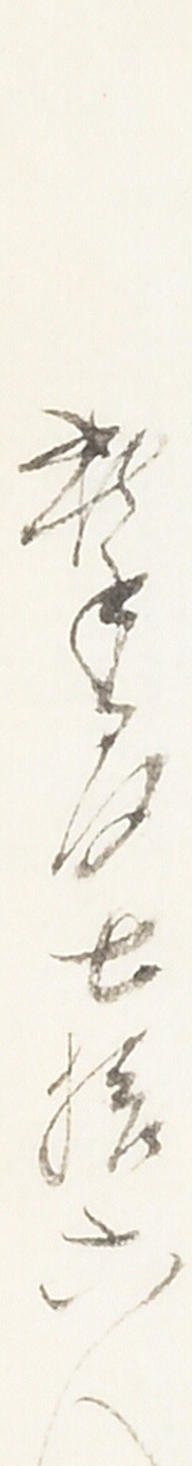此手間七拾六人
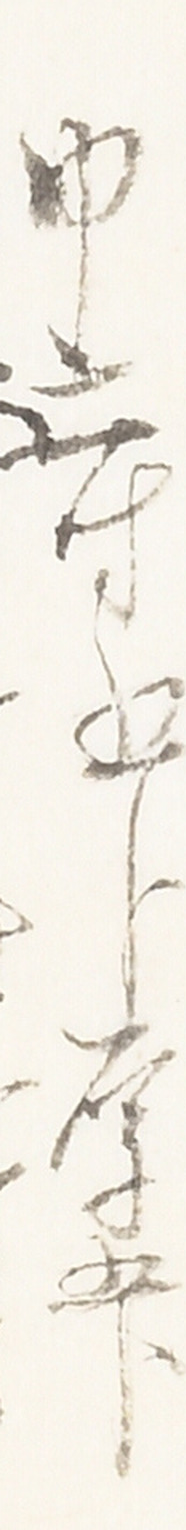巾六寸五分厚五分
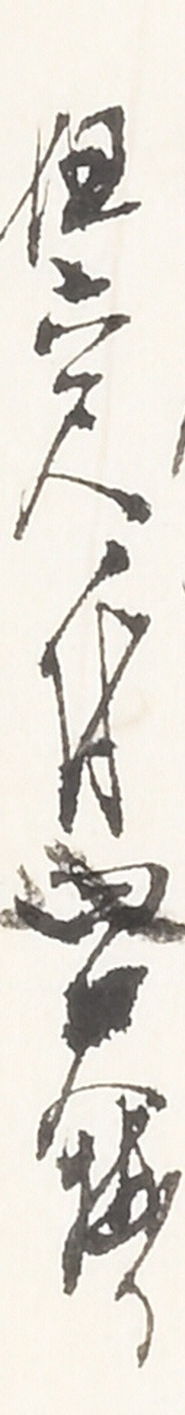但六尺ニ付六人掛り
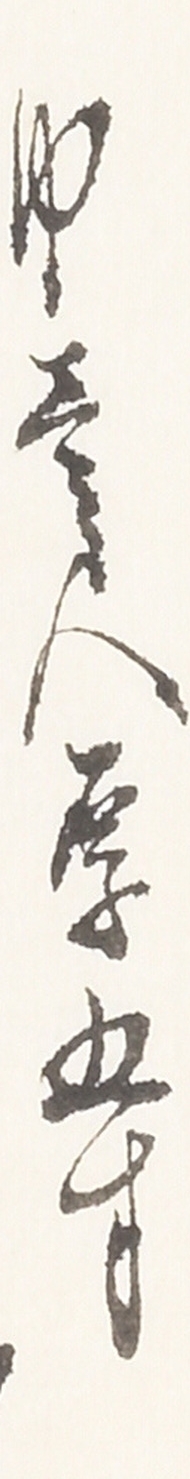巾壱尺厚五寸
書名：天保十一年四月十六日岩窪御廟御普請仕様帳扣
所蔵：伊那市立高遠町図書館・合同会社AMANE
